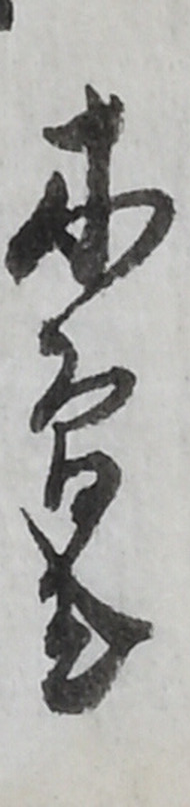木曽屋
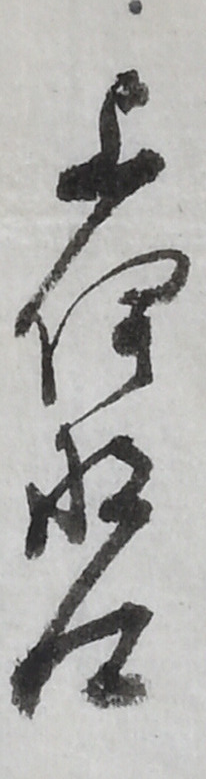上伊那郷
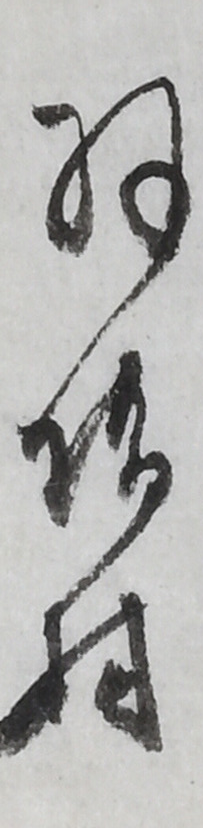羽場村
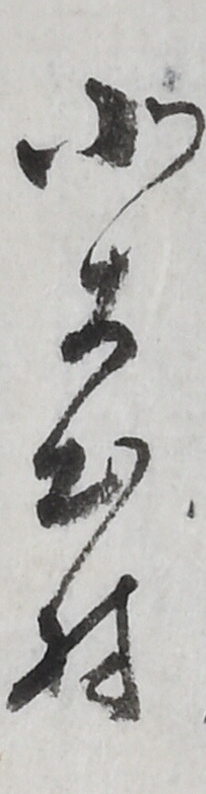北大出村
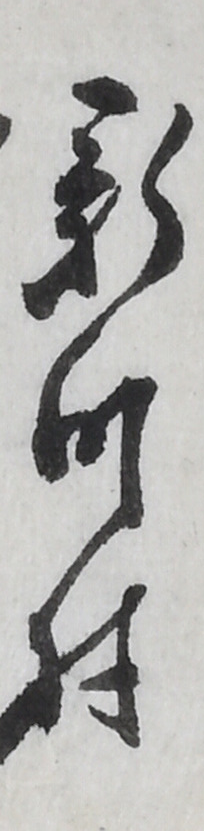新町村
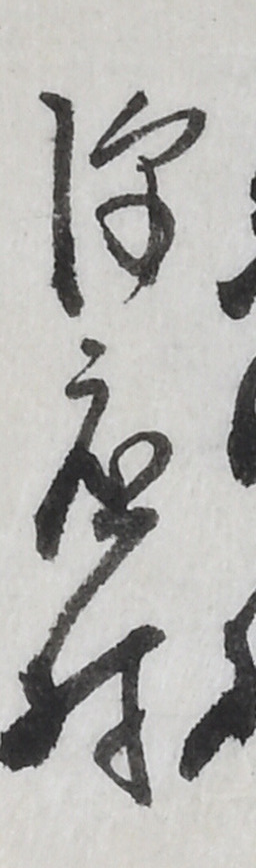沢底村
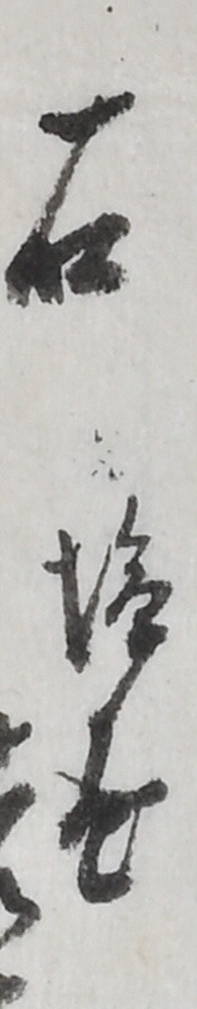右塩屋
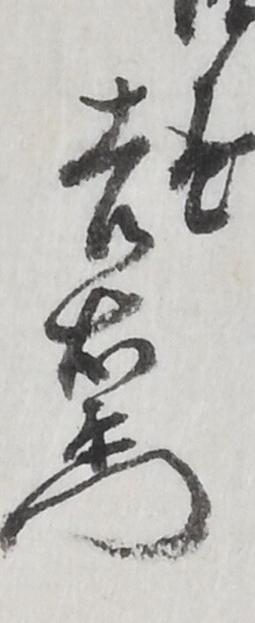吉右衛門
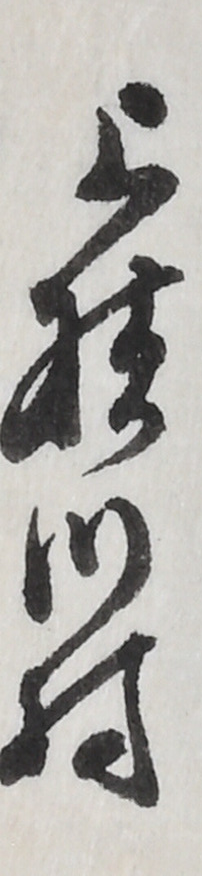上横川村
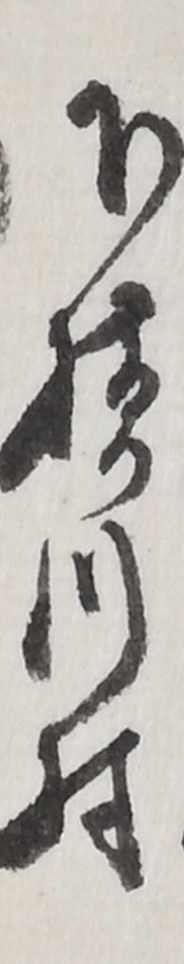下横川村
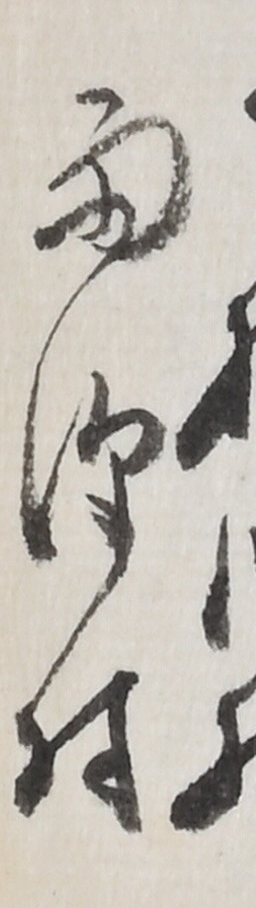雨沢村
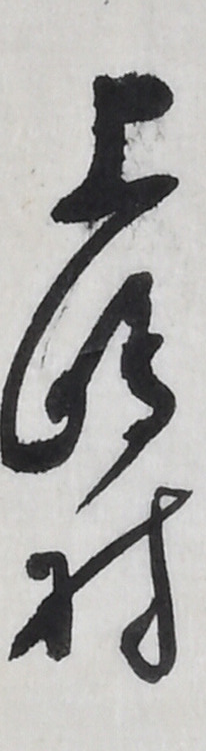上嶋村
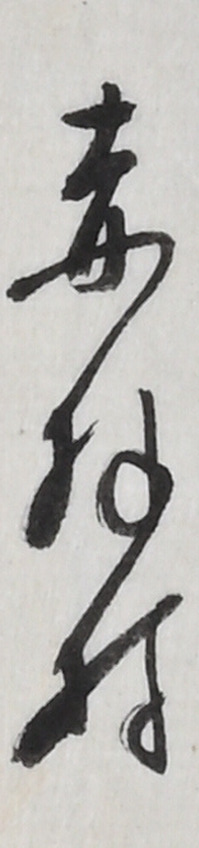赤羽村
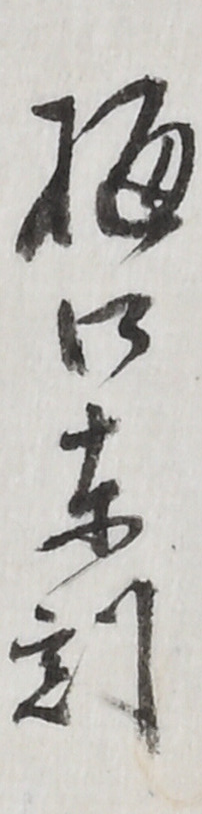樋口東割
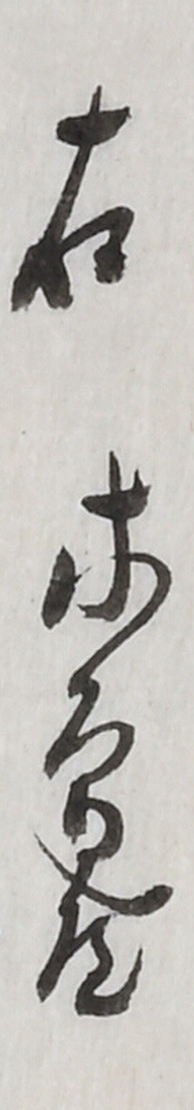右木曽屋
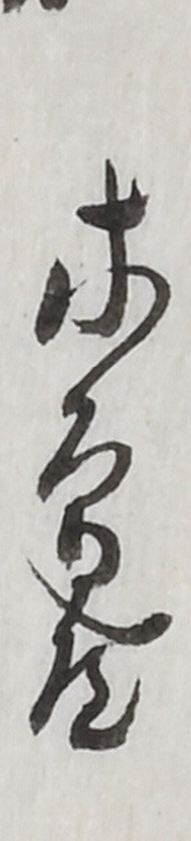木曽屋
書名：年内行事帳
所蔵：伊那市立高遠町図書館・合同会社AMANE
